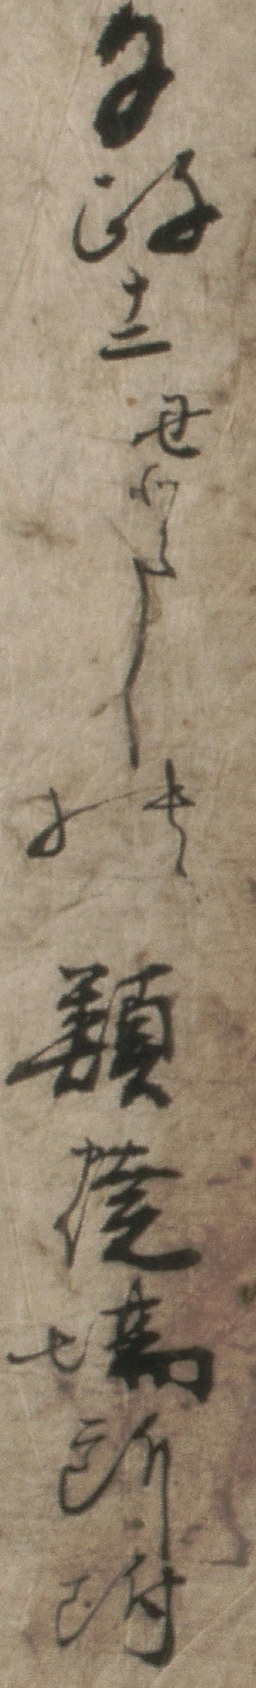文政十二丑としの類焼場所附

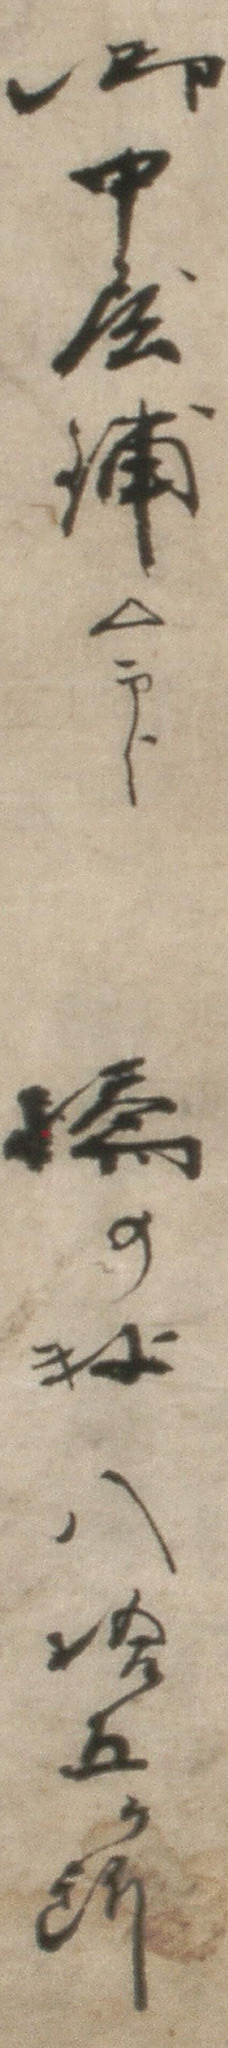御中屋鋪△印橋の数八拾五ヶ所
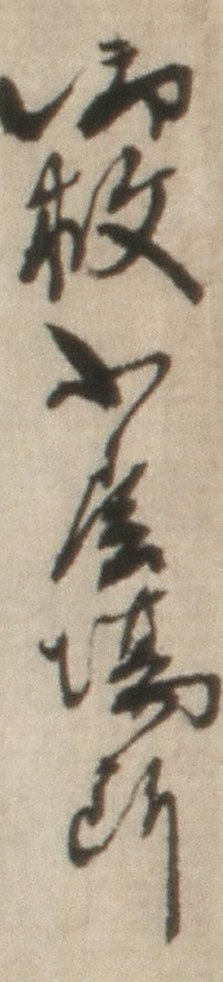御救小屋場所
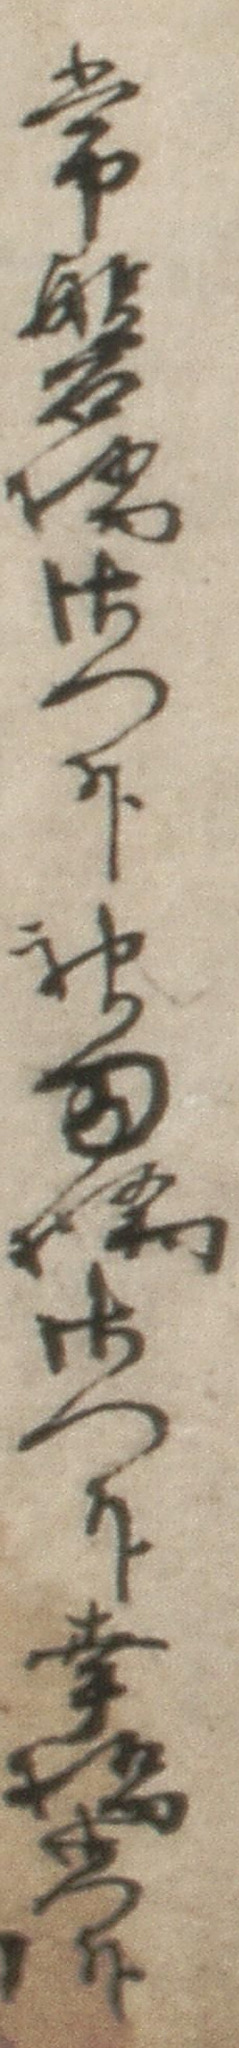常盤橋御門外神田橋御門外幸橋御門外
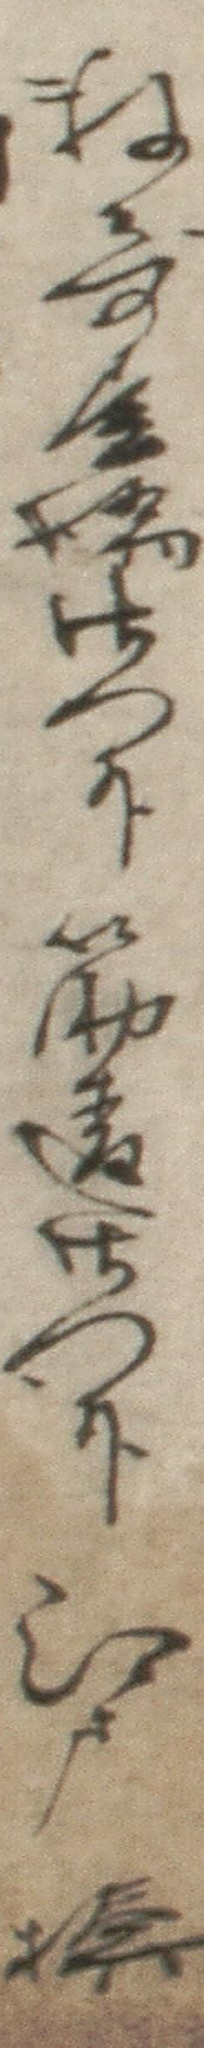数寄屋橋御門外筋違御門外江戸橋
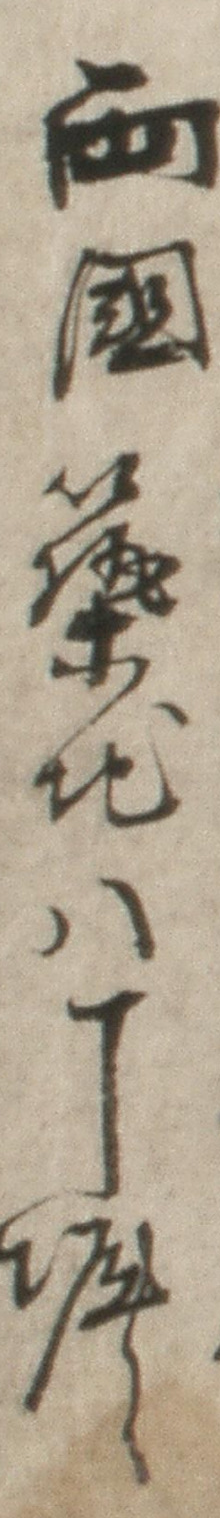両国築地八丁堀
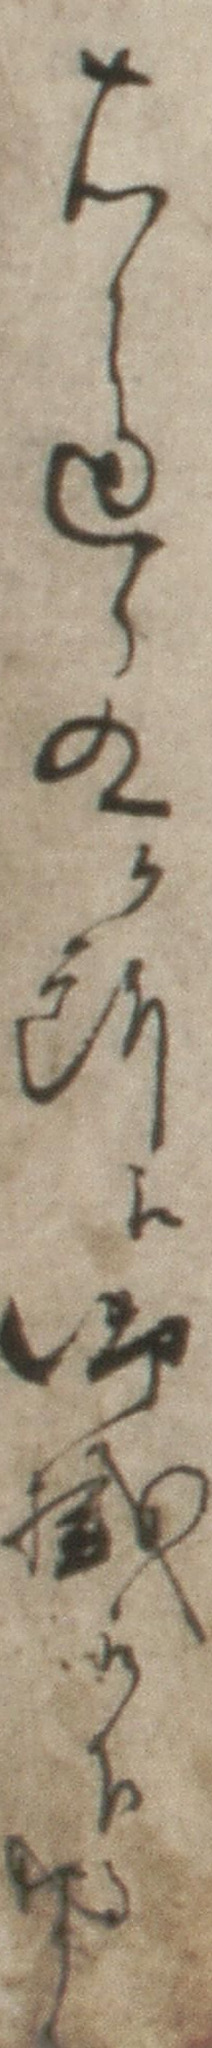右之通り九ヶ所江御掛被下けり

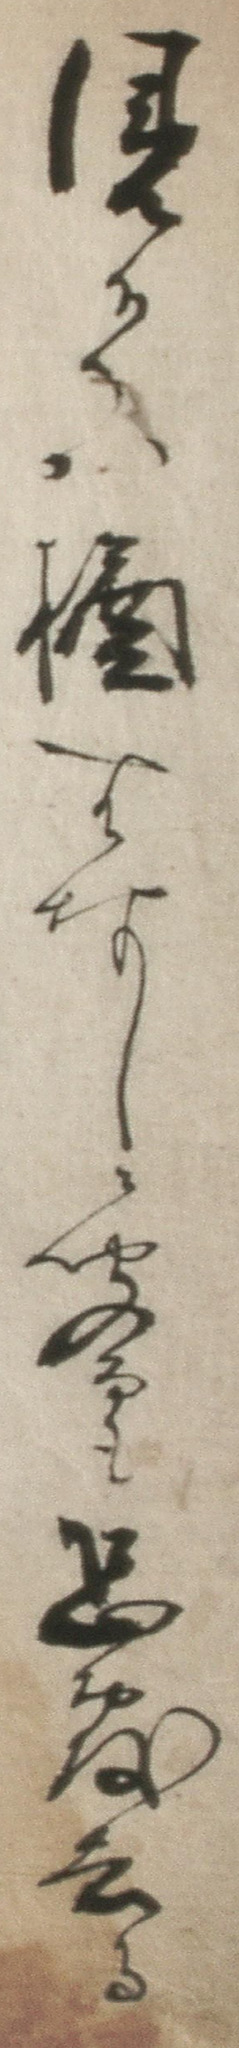見て猶はなし二聞而も恐敷去る
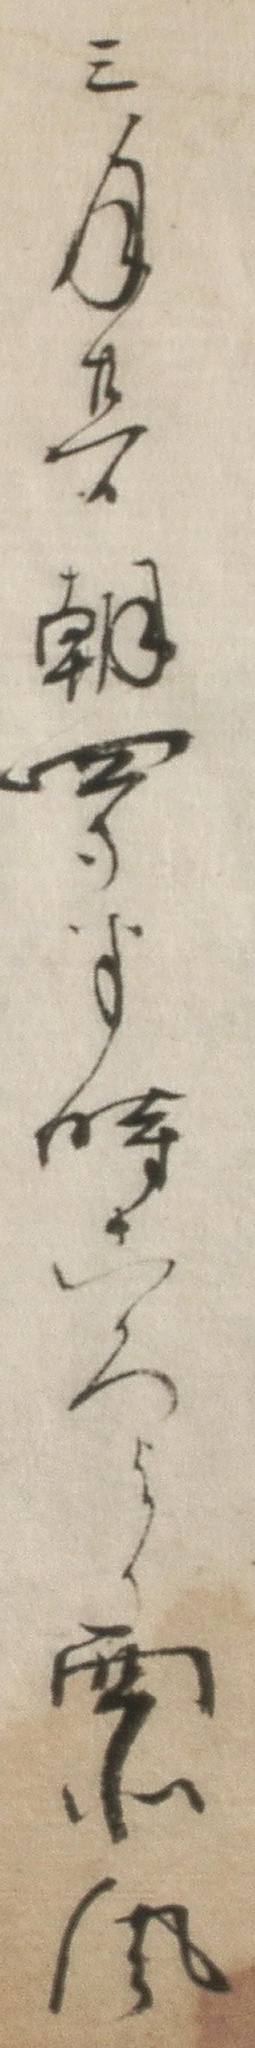三月廿一日朝四ッ半時ころより西北風
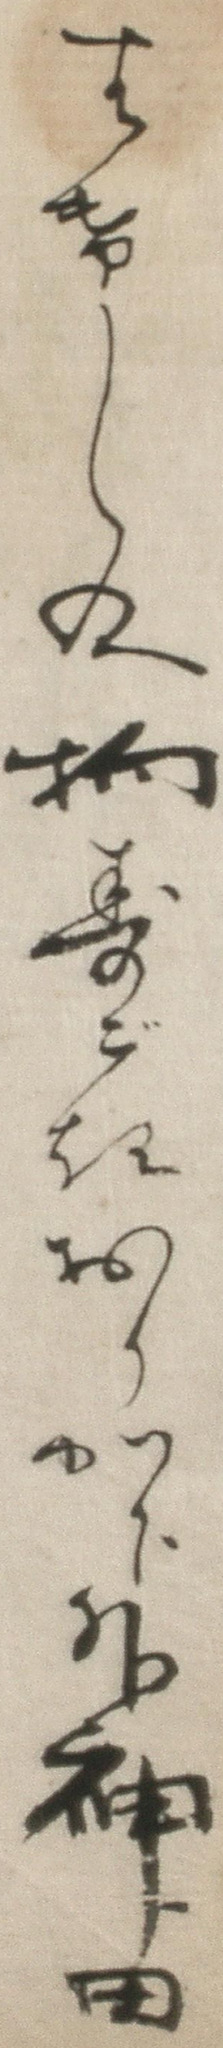はけしく物すごきおりから外神田
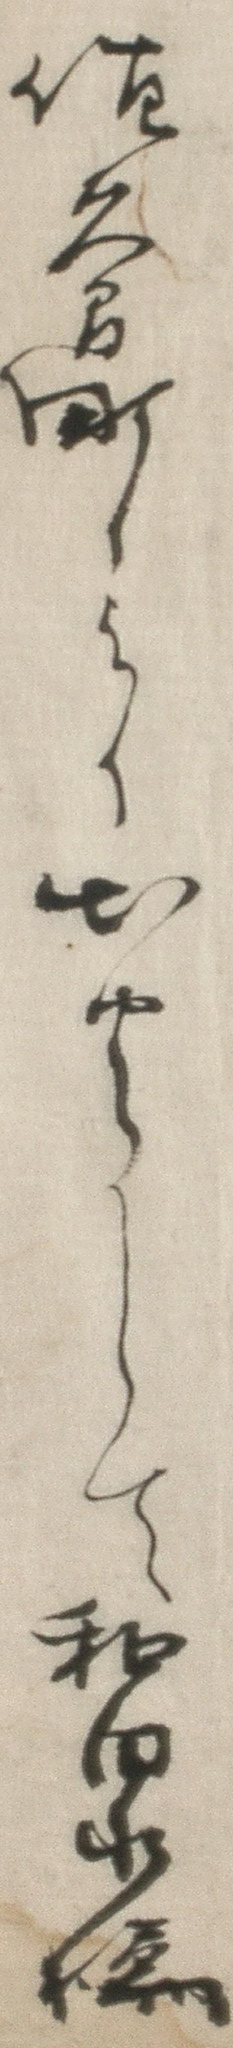佐久間町より出火して和泉橋
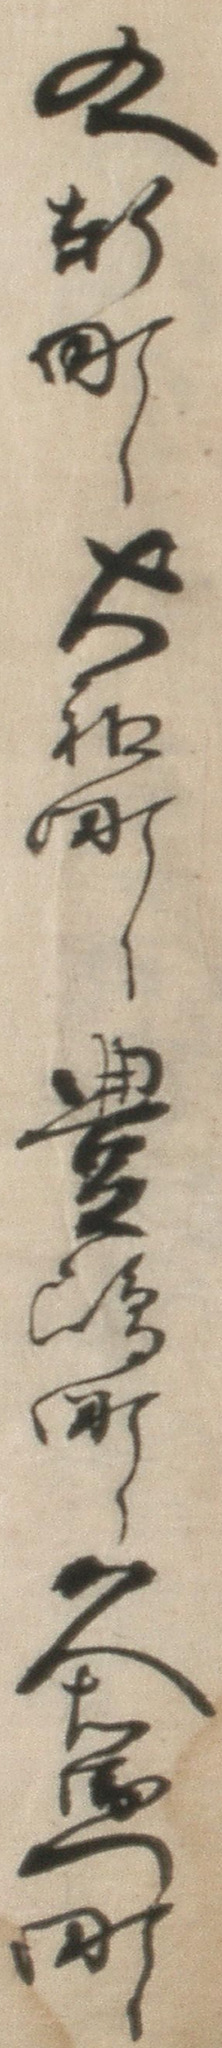九軒町大和町豊島町久右衛門町
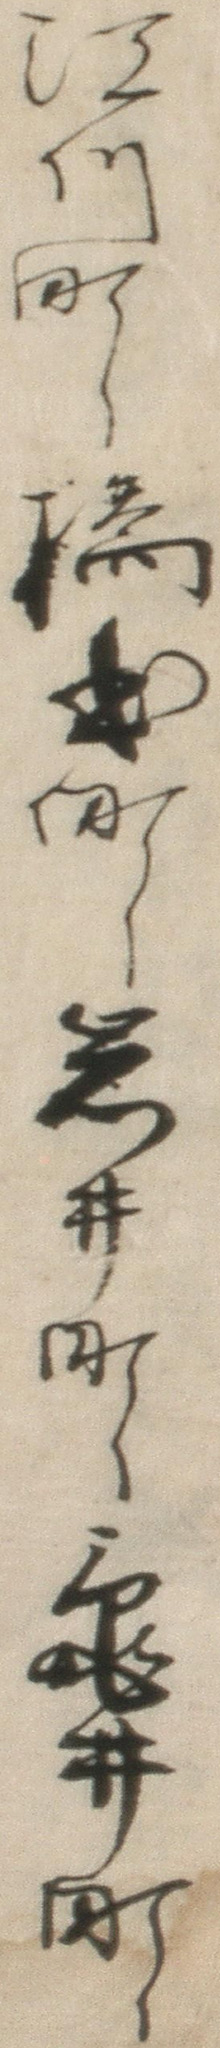江川町橋本町岩井町亀井町
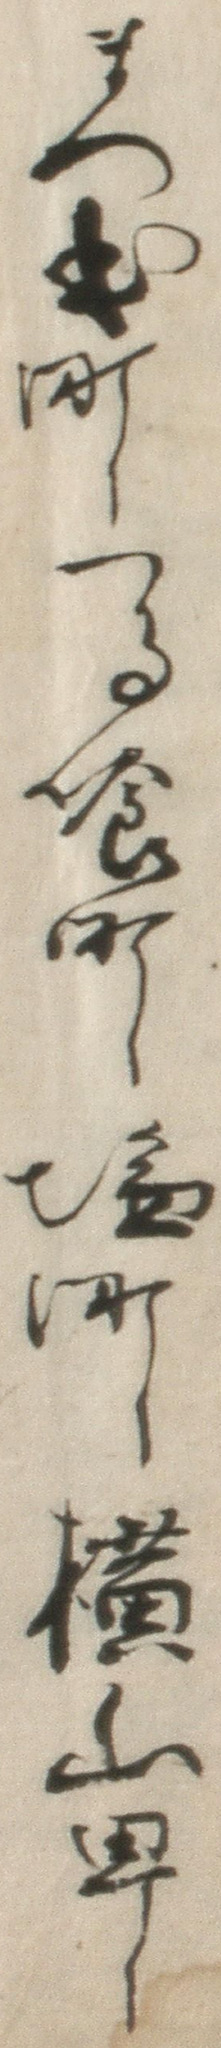まつ本町馬喰町塩町横山町
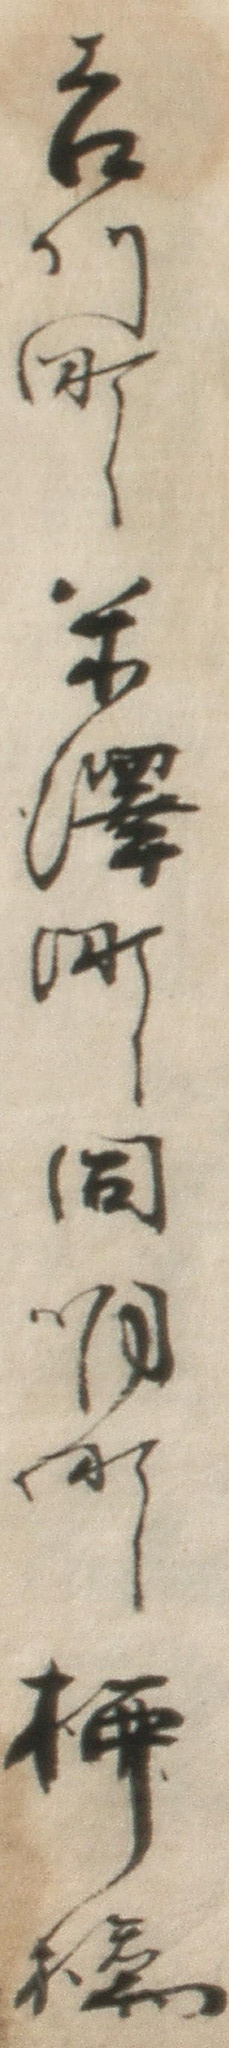吉川町米沢町同明町柳橋
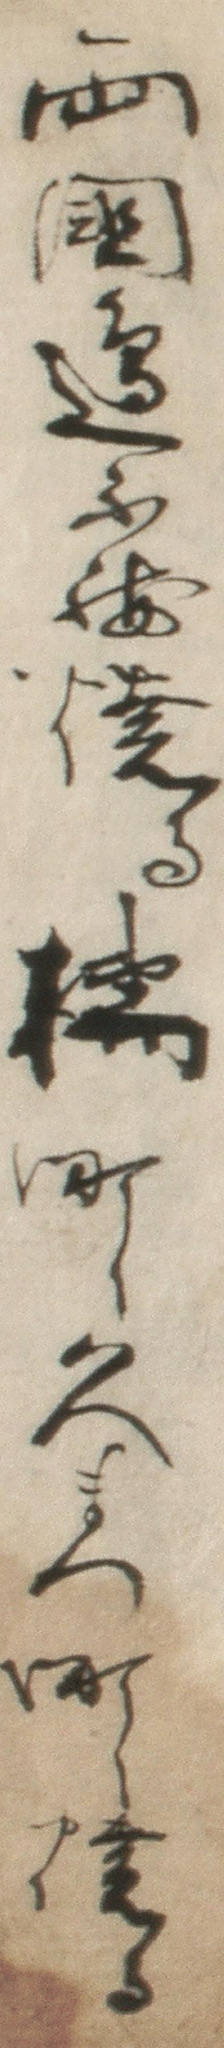両国辺不残焼る橘町久右衛門町焼る
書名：文政十二丑としの類焼場所附
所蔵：東京大学地震研究所図書室 Earthquake Research Institute Library, The University of Tokyo, JAPAN
